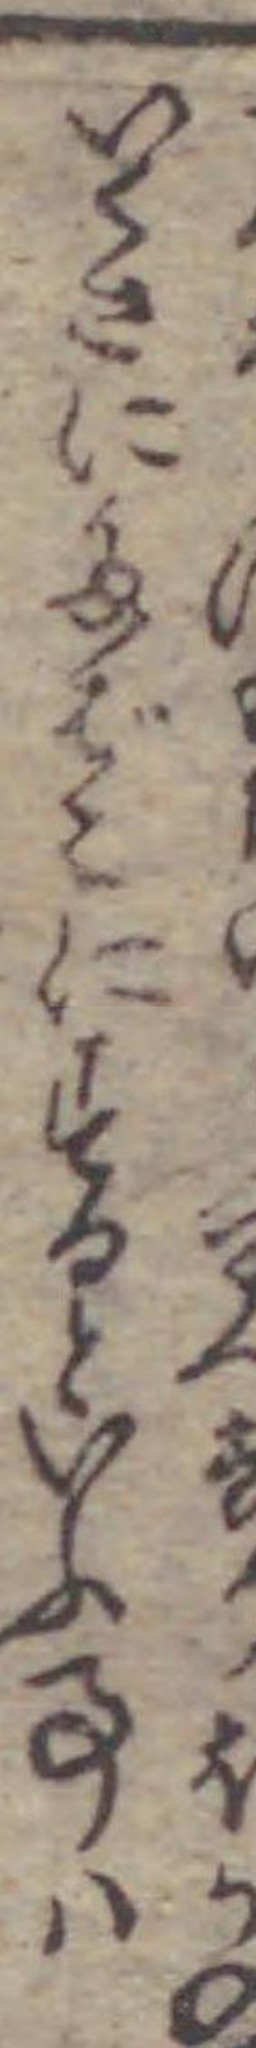いくさにたばこにするといふ事は
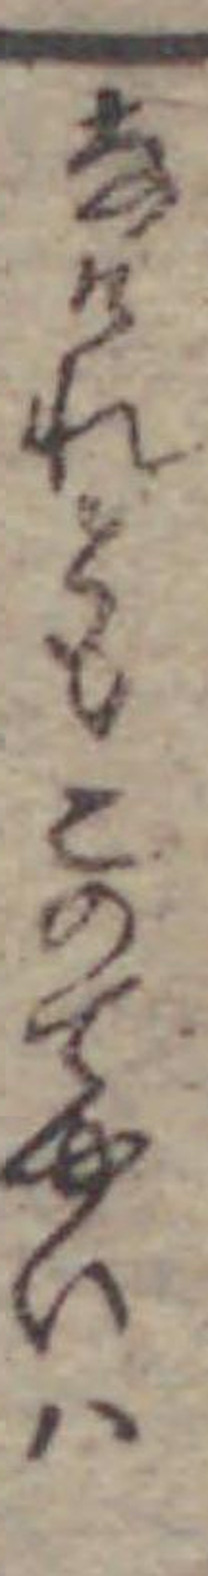なけれともこのてやいは
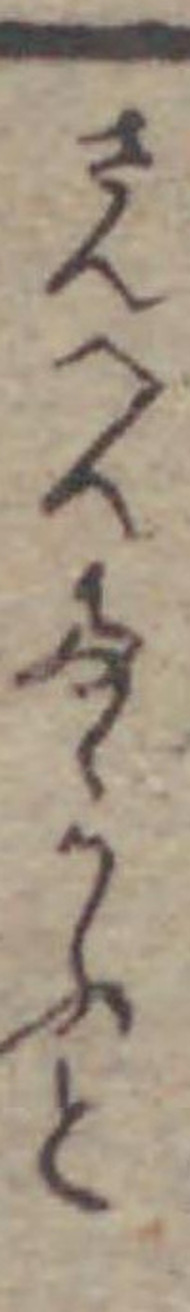さんへんたゝかふと
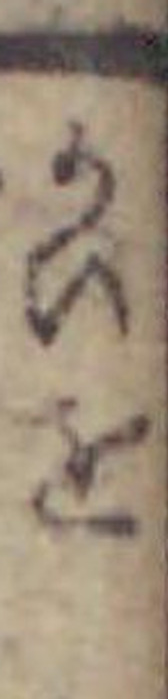かいを
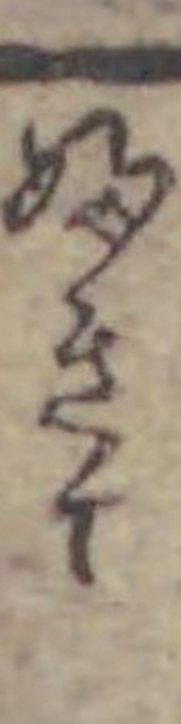ふきて
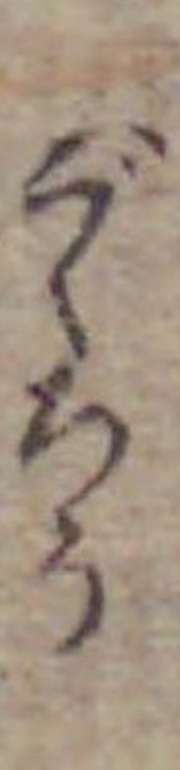ごくろう
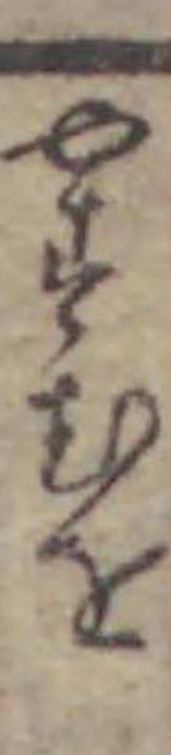やすむを
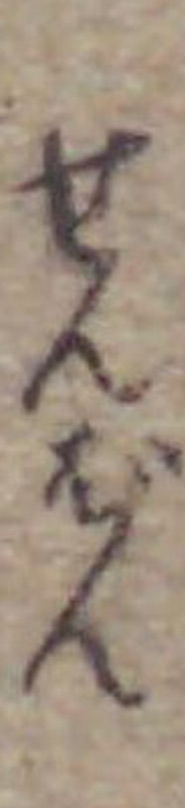せんばん
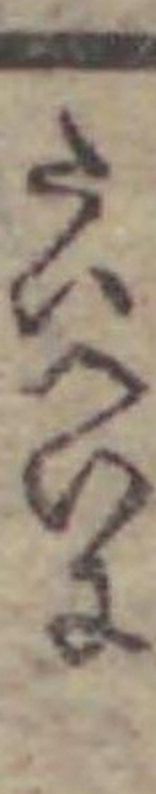たいへいに
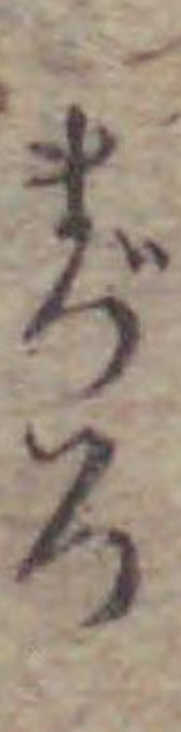まづいつ
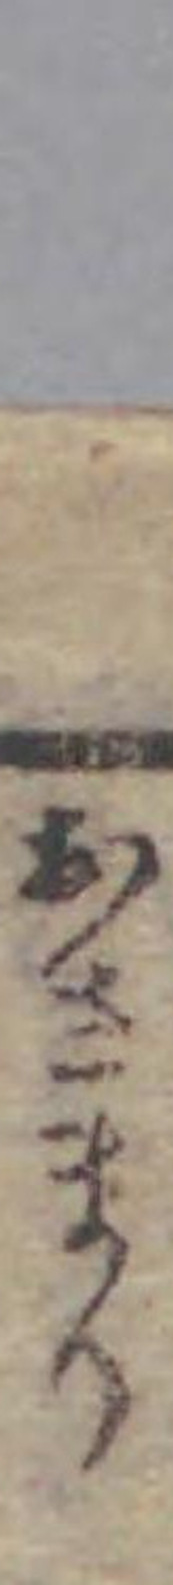おさまり
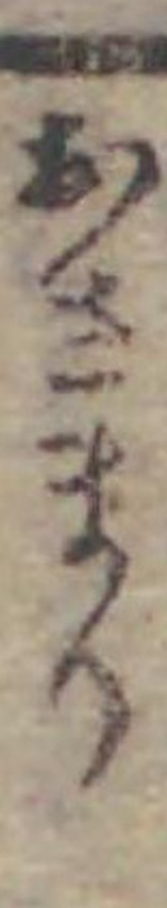おさまり
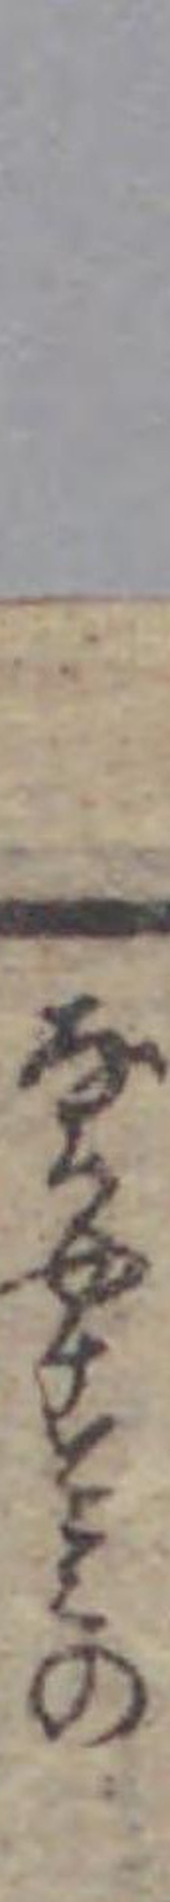なかやすみの
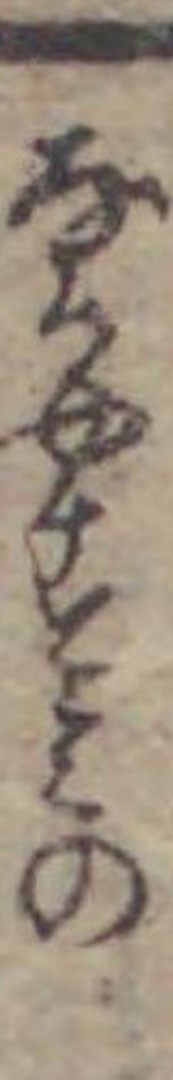なかやすみの
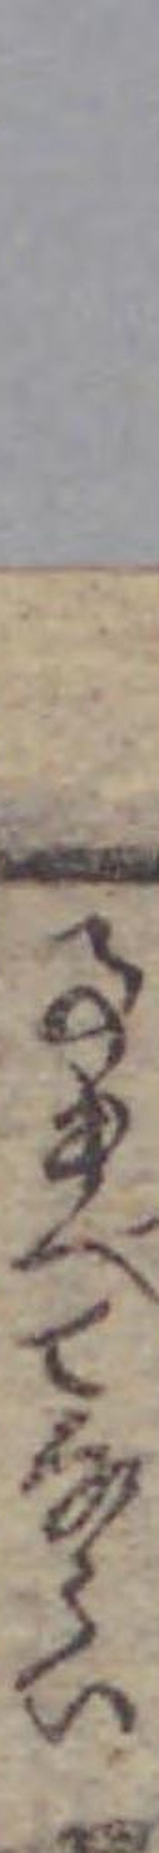事ゆへてならい
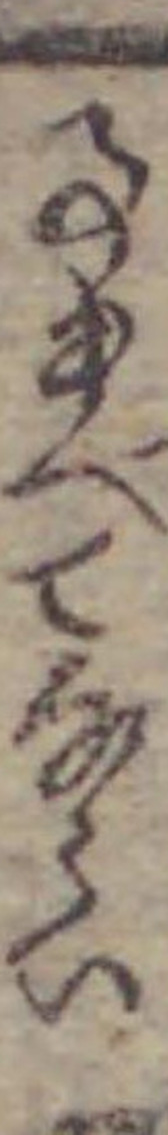事ゆへてならい
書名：談芭菰誉詞 : 3巻
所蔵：国立国会図書館 National Diet Library, JAPAN
